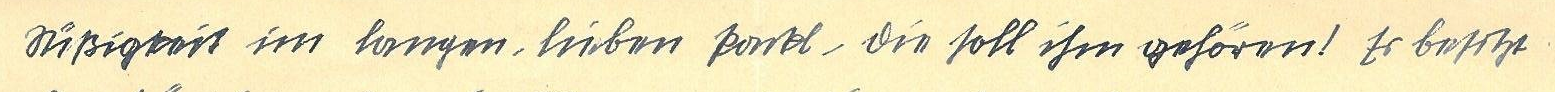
Süßigkeit im langen, lieben Packl, die soll ihm gehören! Er besitzt
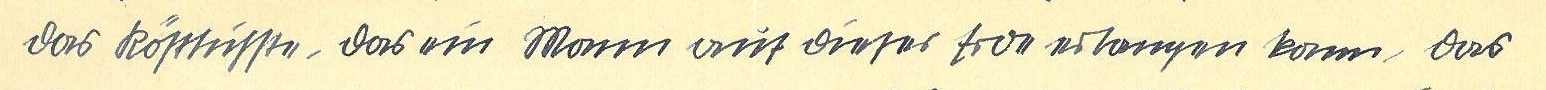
das Köstlichste, das ein Mann auf dieser Erde erlangen kann, das
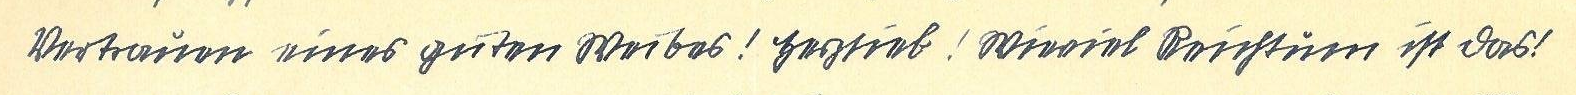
Vertrauen eines guten Weibes! Herzlieb! Wieviel Reichtum ist das!
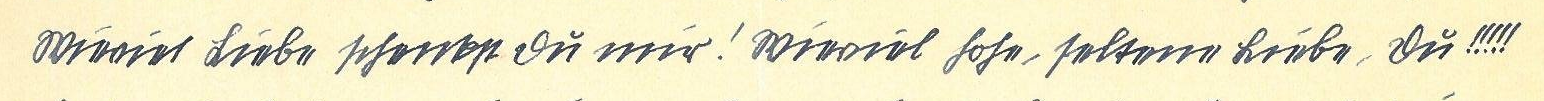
Wieviel Liebe schenkst Du mir! Wieviel hohe, seltene Liebe, Du!!!!!
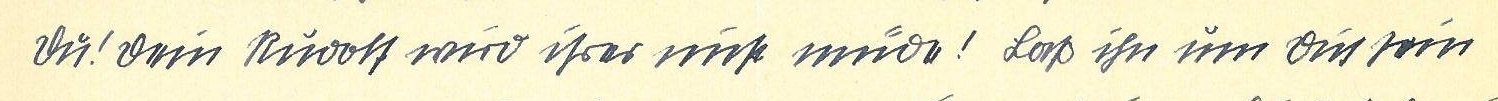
Du! Dein wird ihrer nicht müde! Laß ihn um Dich sein
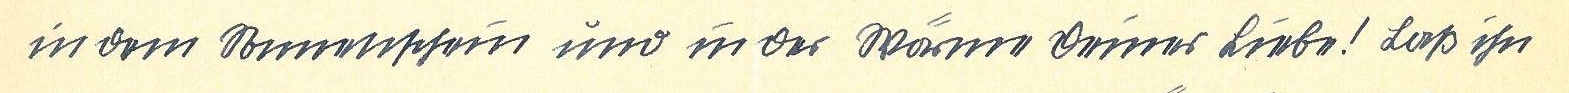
in dem Sonnenschein und in der Wärme Deiner Liebe! Laß ihn
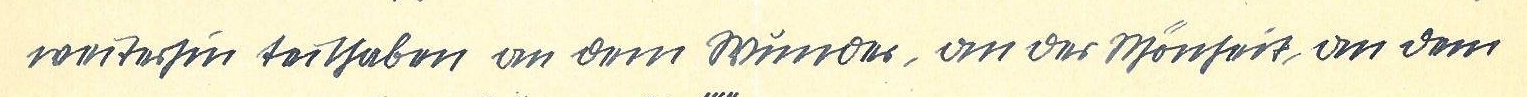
weiterhin teilhaben an dem Wunder, an der Schönheit, an dem
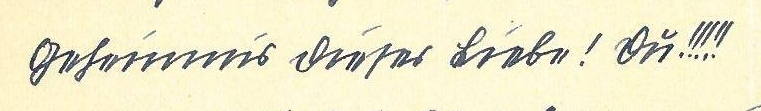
Geheimnis dieser Liebe! Du!!!!!
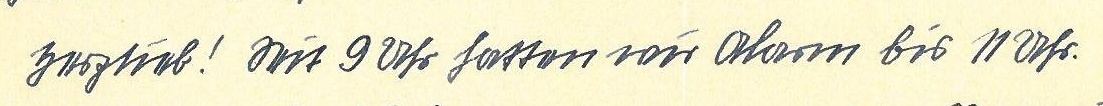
Herzlieb! Seit 9 Uhr hatten wir Alarm bis 11 Uhr.
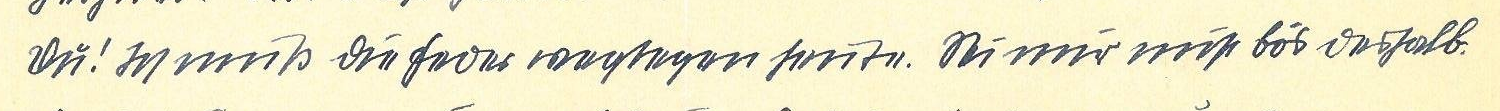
Du! Ich muß die Feder weglegen heute. Sei mir nicht bös deshalb.
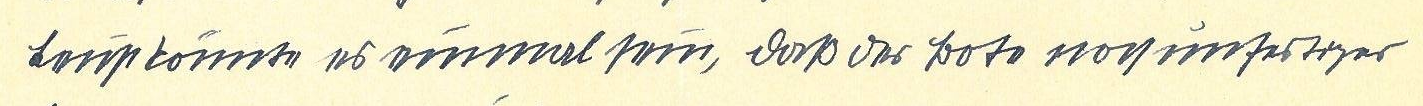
Leicht könnte es einmal sein, daß der Bote noch unfertiger
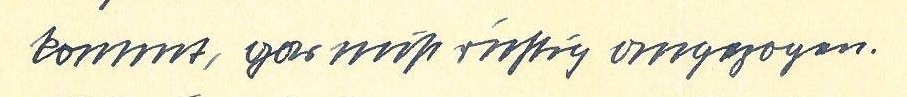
kommt, gar nicht richtig angezogen.
